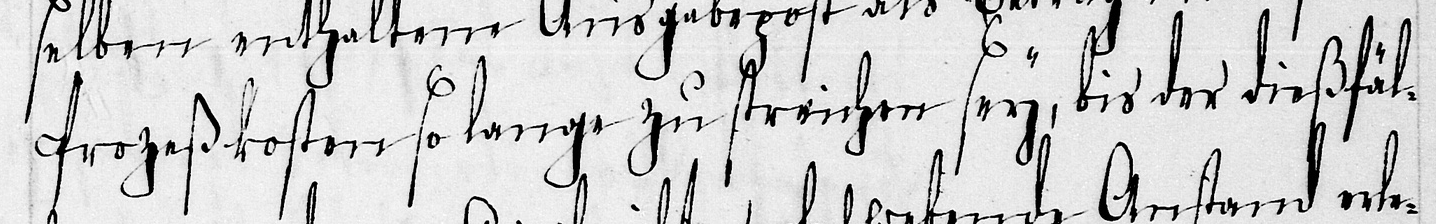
Prozeßkosten so lange zu streichen sey, bis der dießfäl¬
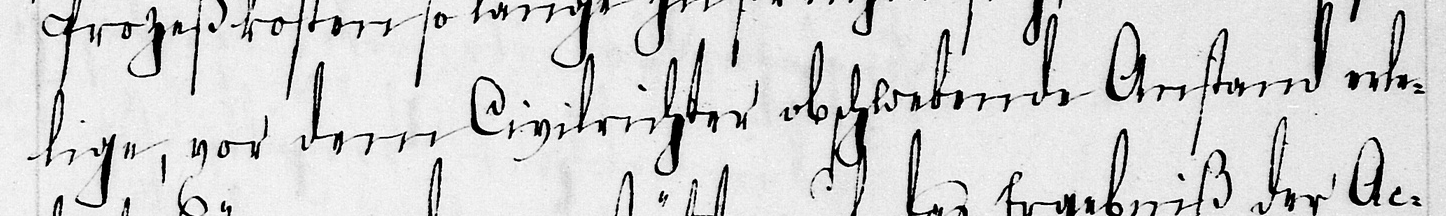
lige, vor dem Civilrichter obschwebende Anstand erle¬
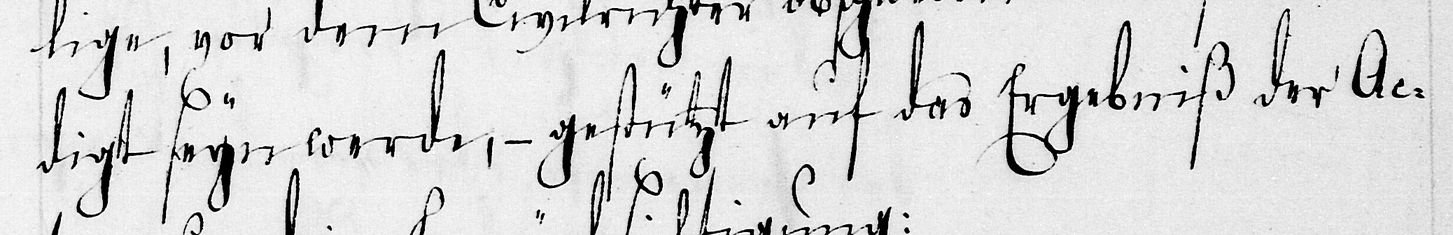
digt seyn werde, – gestützt auf das Ergebniß der Ac¬
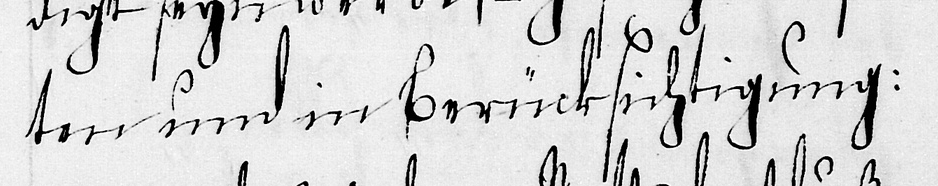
ten und in Berücksichtigung:
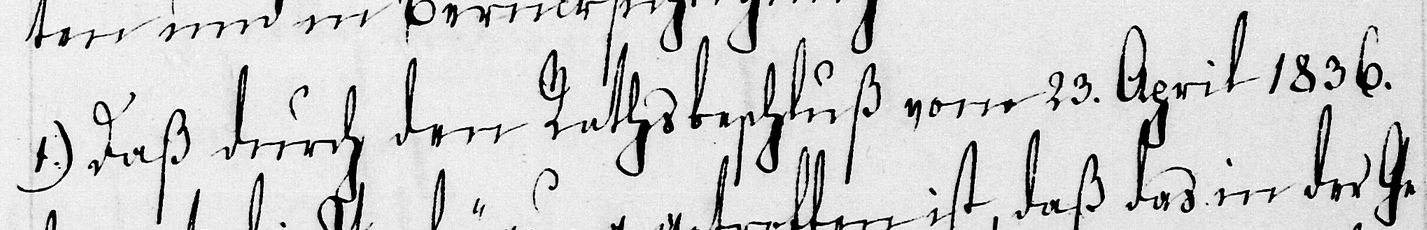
1.) Daß durch den Rathsbeschluß vom 23. April 1836.
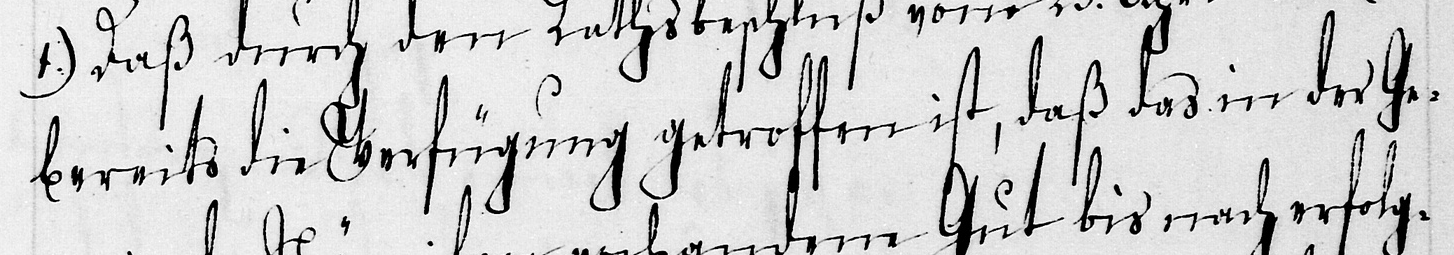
bereits die Verfügung getroffen ist, daß das in der G¬
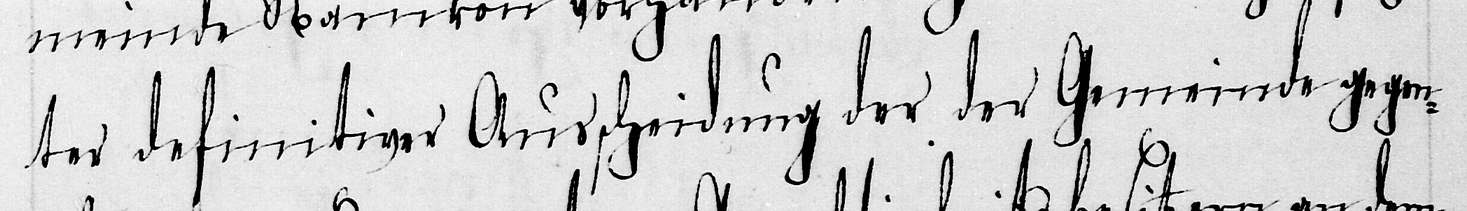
ter definitiver Ausscheidung der der Gemeinde gegen¬
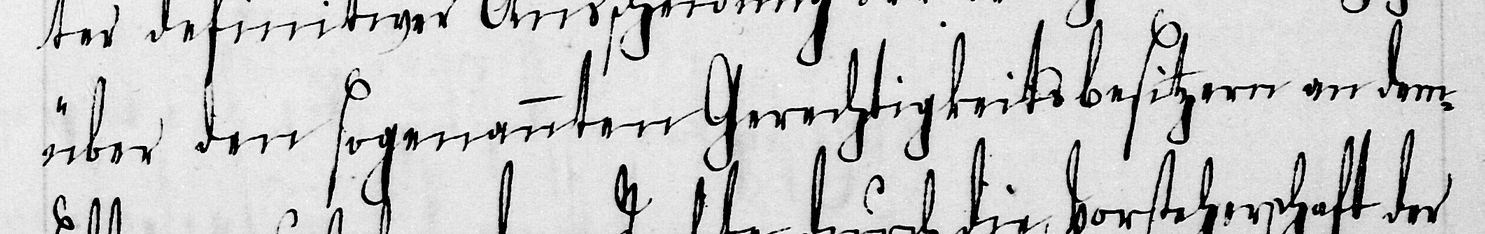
über den sogenannten Gerechtigkeitsbesitzern an dem¬
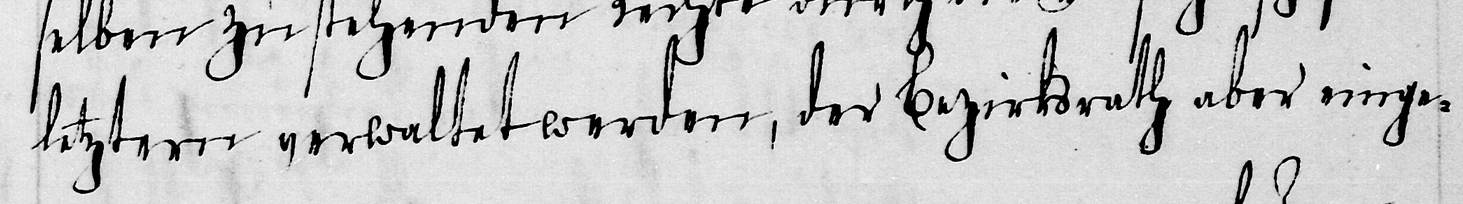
letztern verwaltet werden, der Bezirksrath aber einge-
